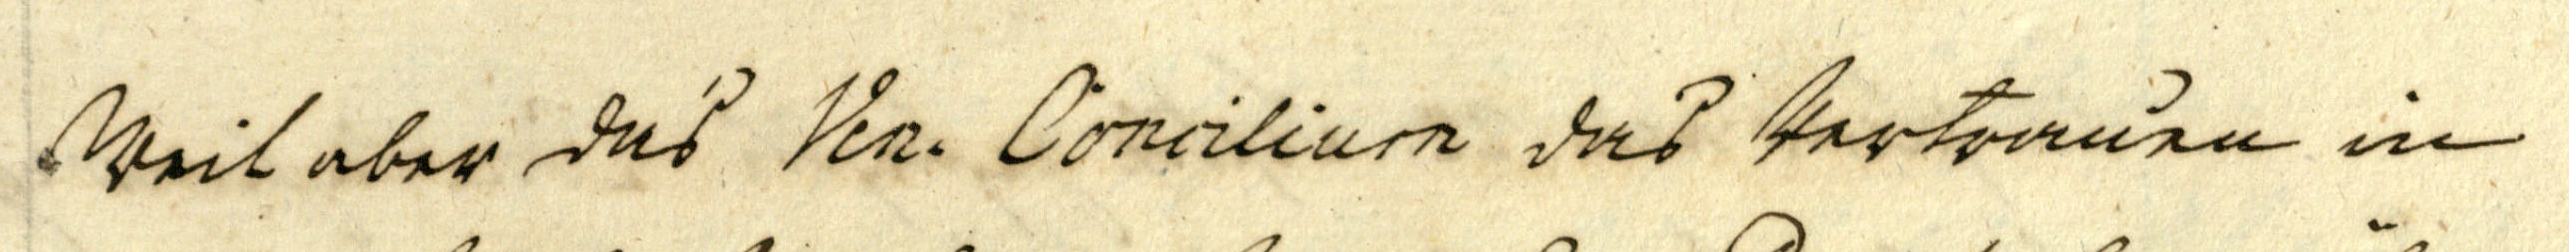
Weil aber das Ven. Concilium das Vertrauen in
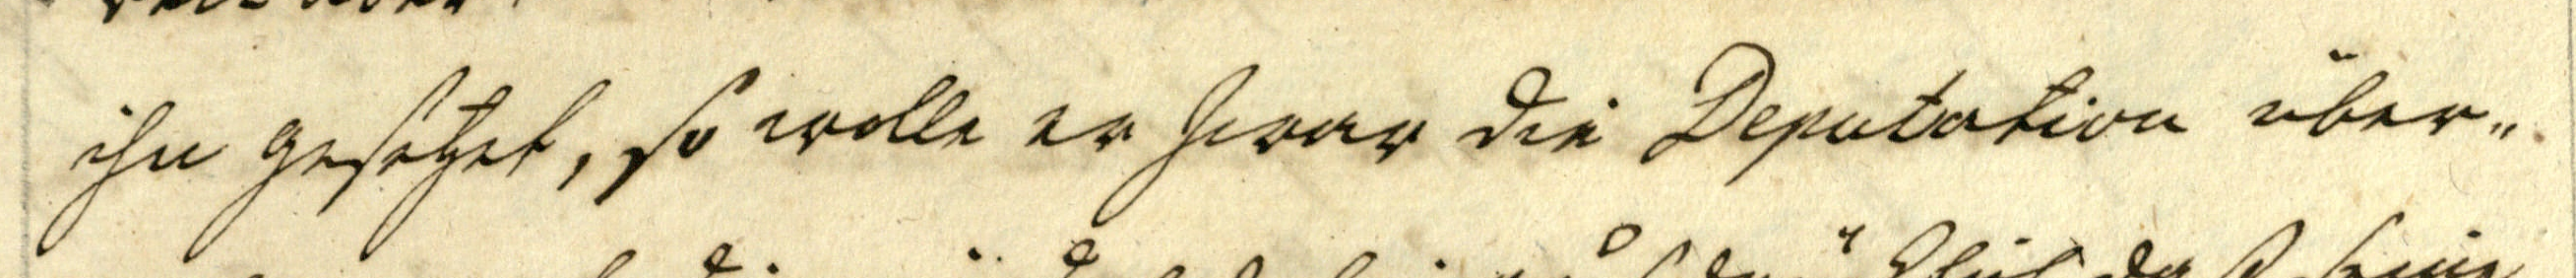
ihn gesetzet, so wolle er zwar die Deputation über¬
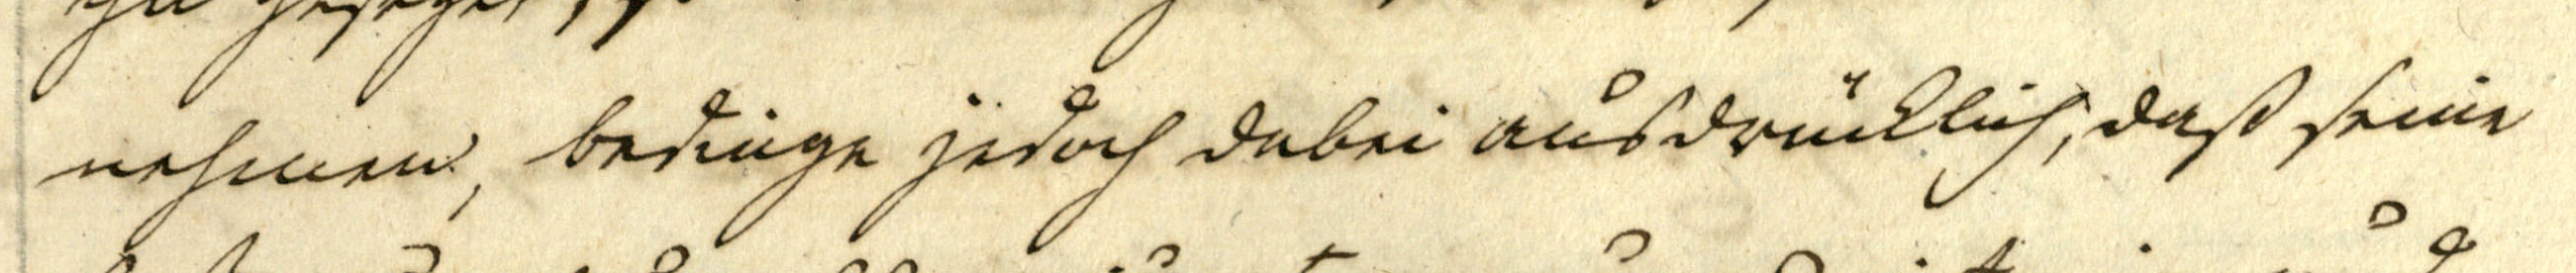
nehmen, bedünge jedoch dabei ausdrücklich, daß seine
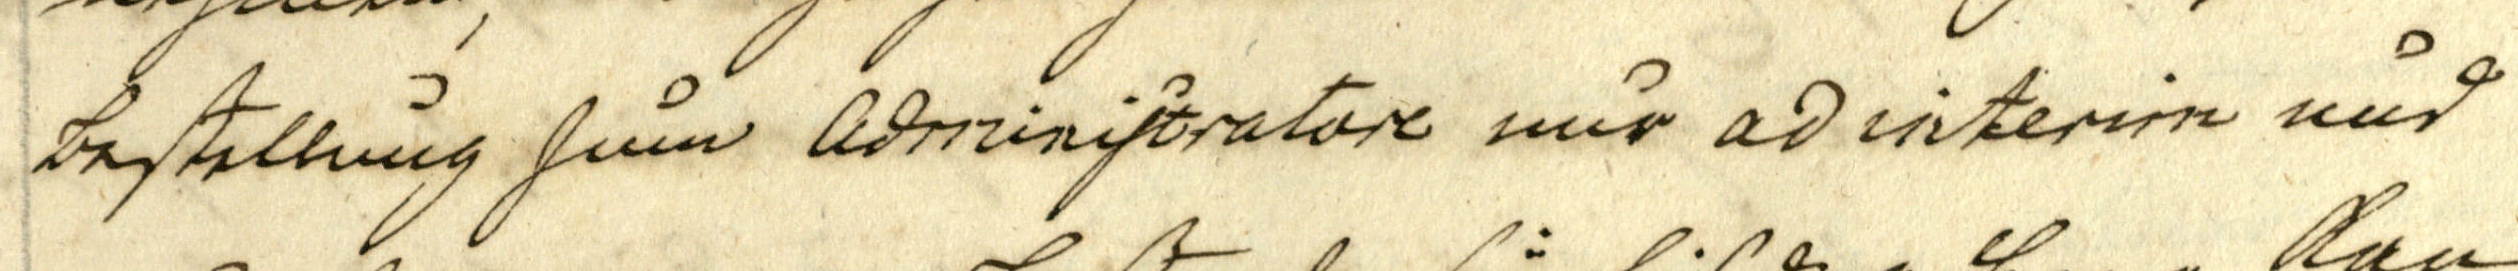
Bestellung zum Administratore nur ad interim und
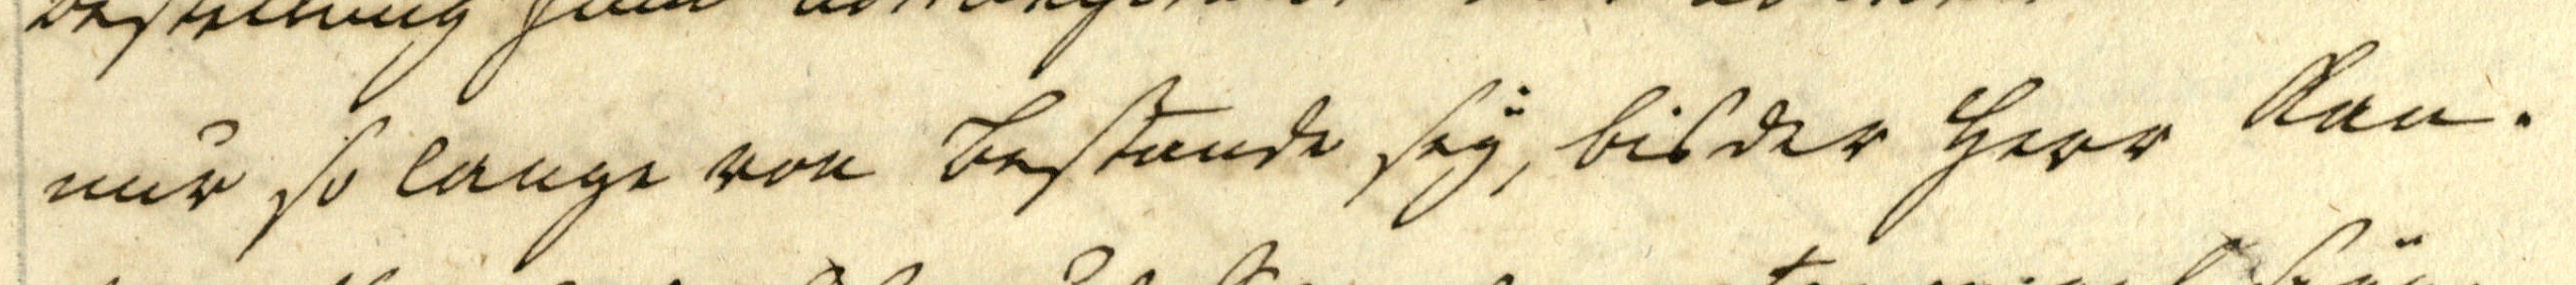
nur so lange von Bestande seÿ, bis der Herr Kan¬
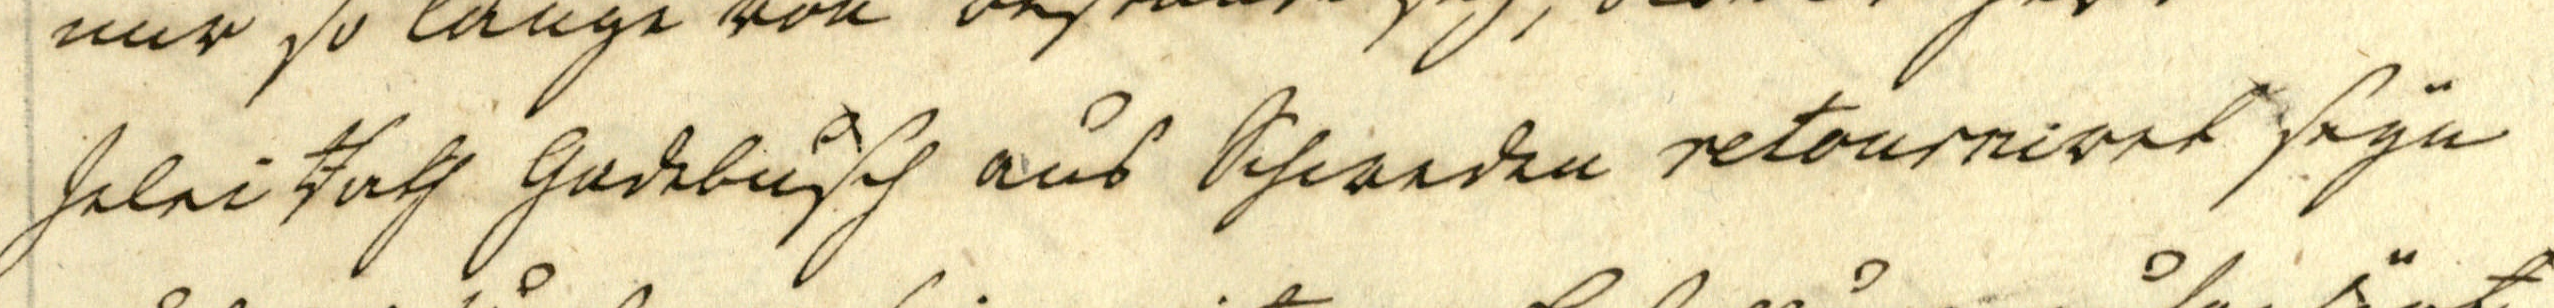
helei Rath Gadebusch aus Schweden retourniret seÿn
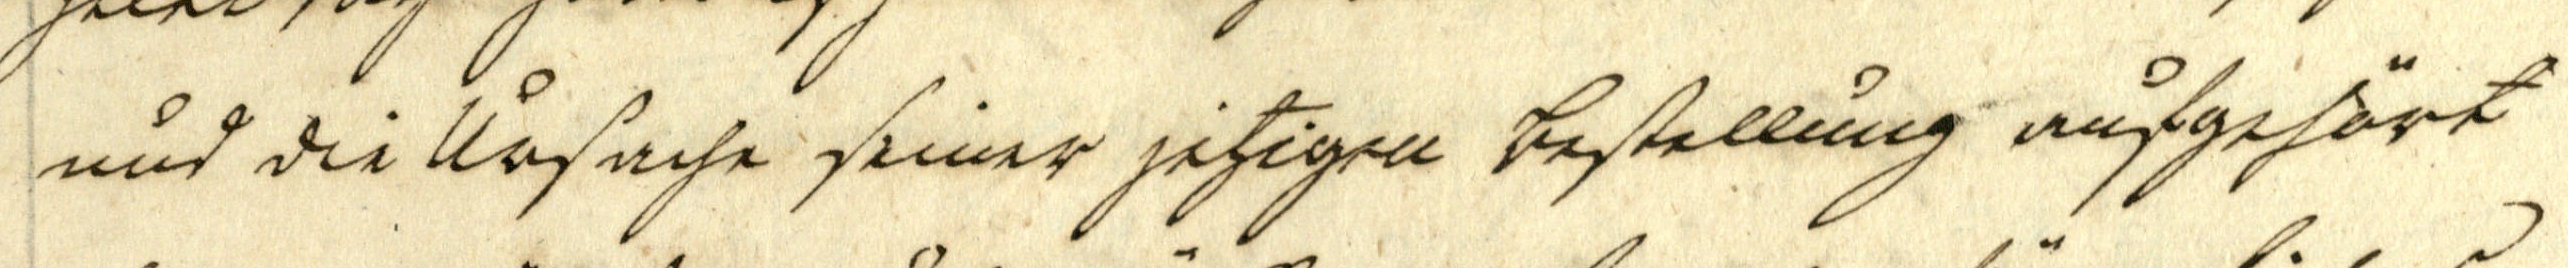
und die Ursache seiner jetzigen Bestellung aufgehört
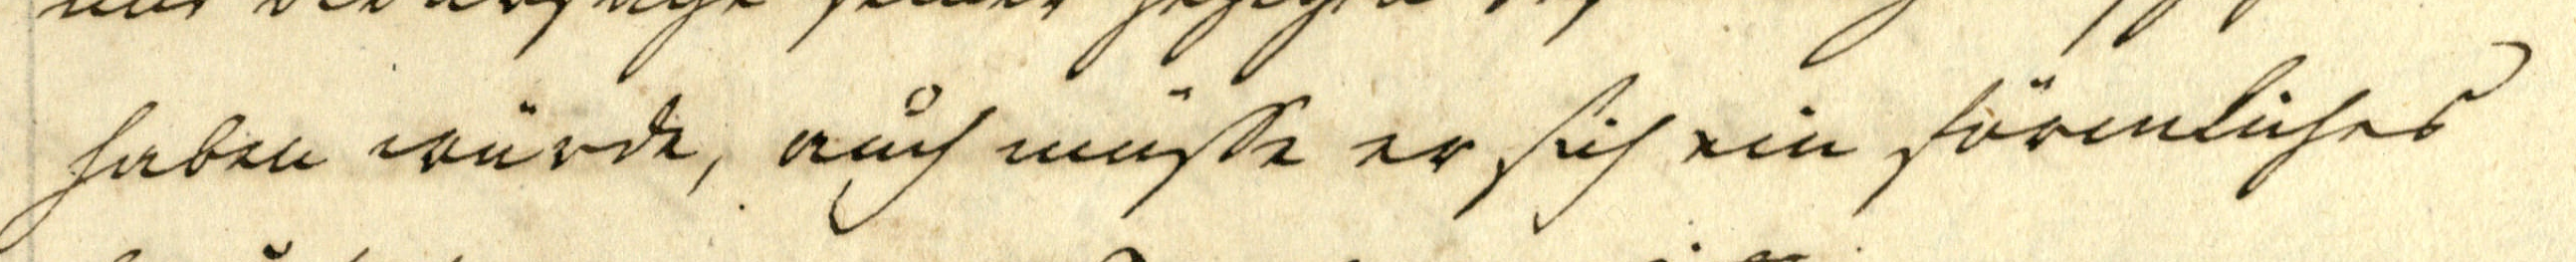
haben würde, auch müsse er sich ein förmliches
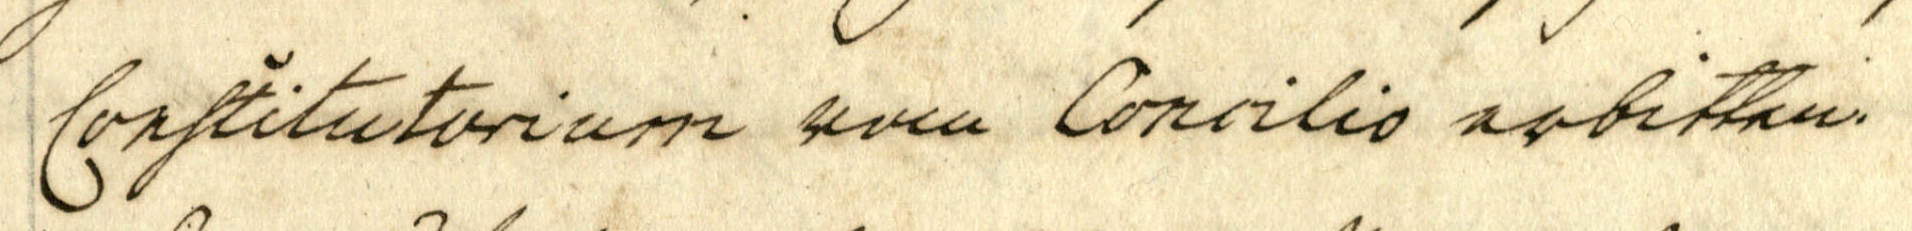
Constitutorium vom Concilio erbitten.
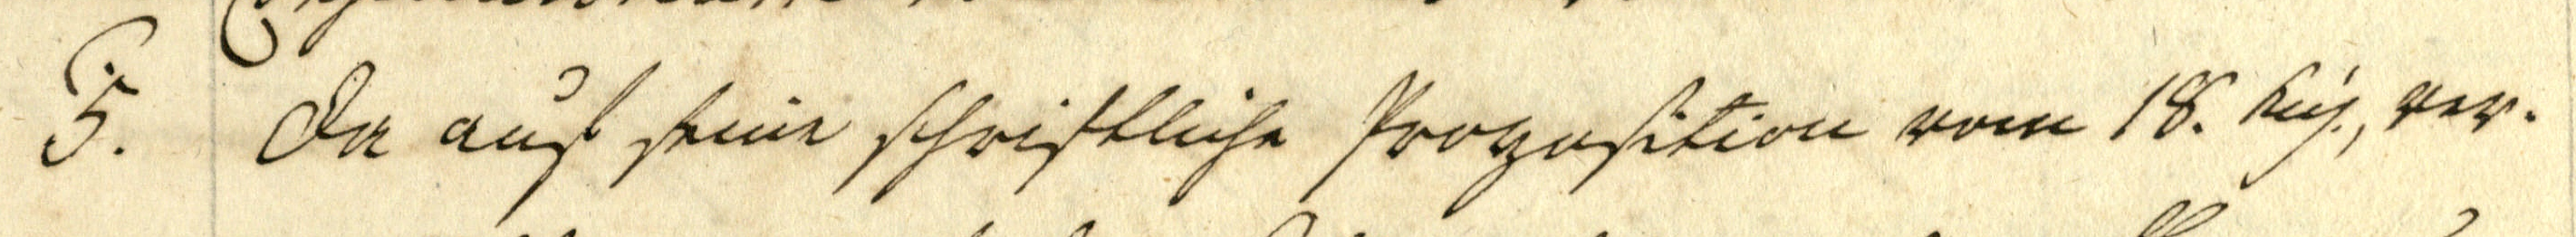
5. Da auf seine schriftliche Proposition vom 18. huj., ver¬
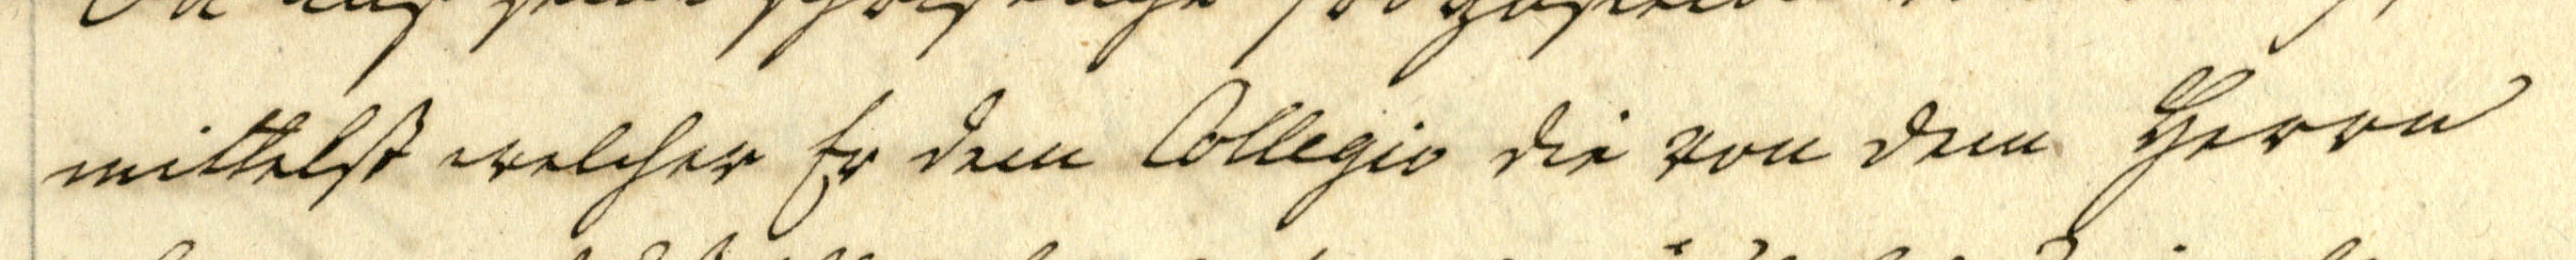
mittelst welcher Er dem Collegio die von dem Herrn
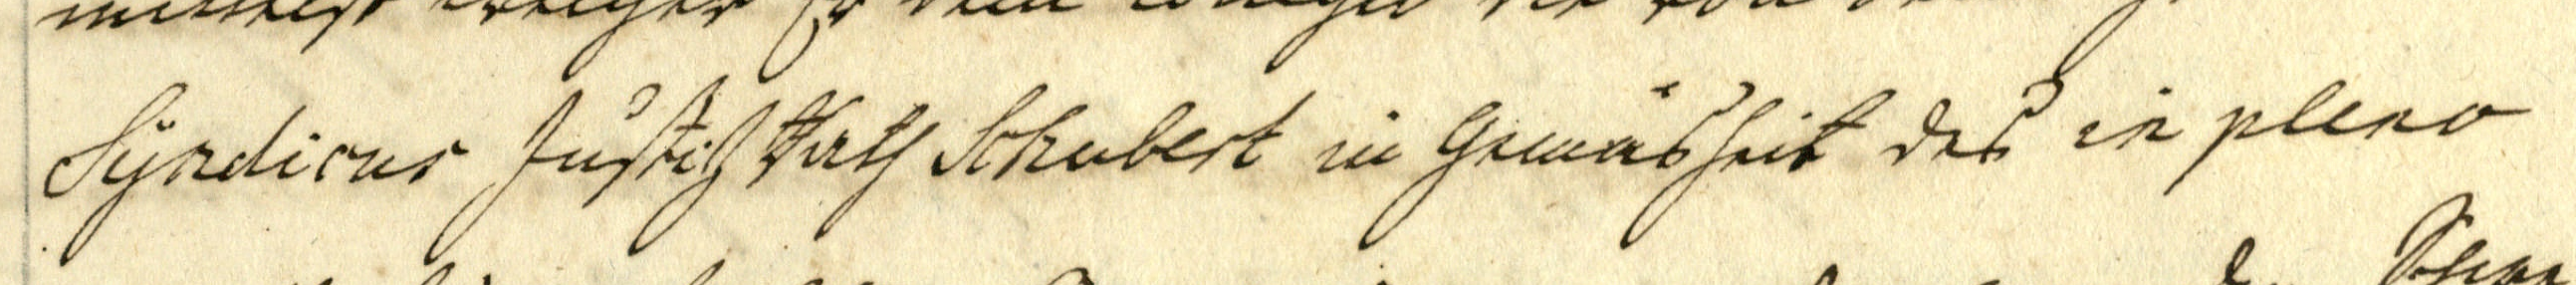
Sÿndicus Justiz Rath Schubert in Gemäsheit des in pleno
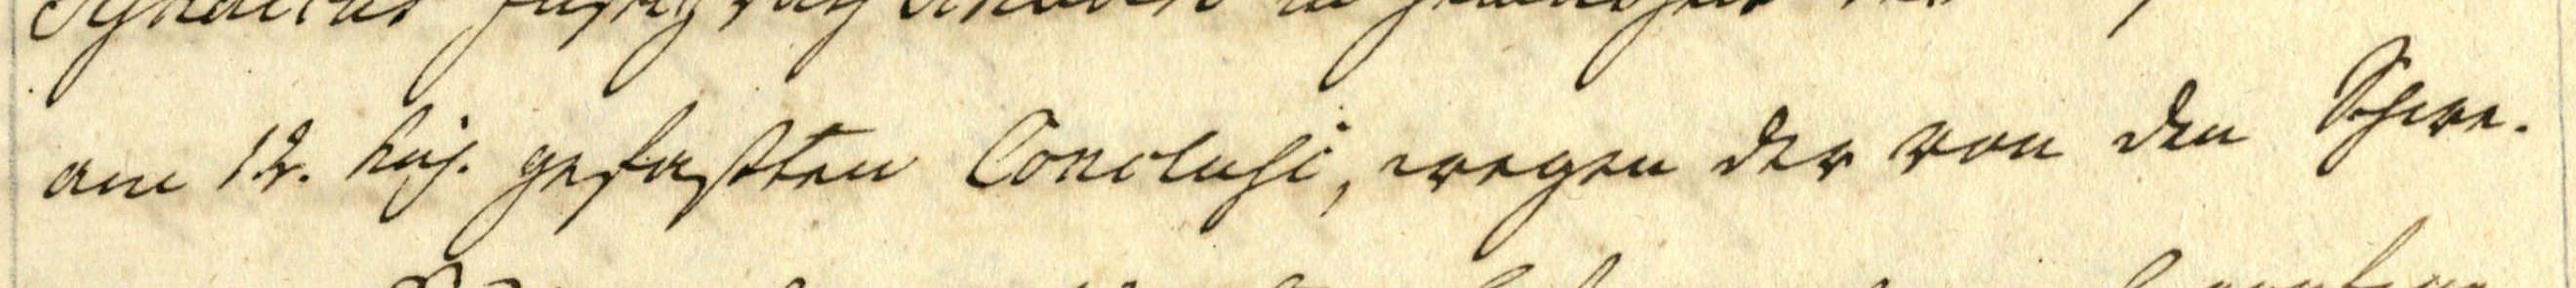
am 12. huj. gefaßten Conclusi, wegen der von den Schwe¬
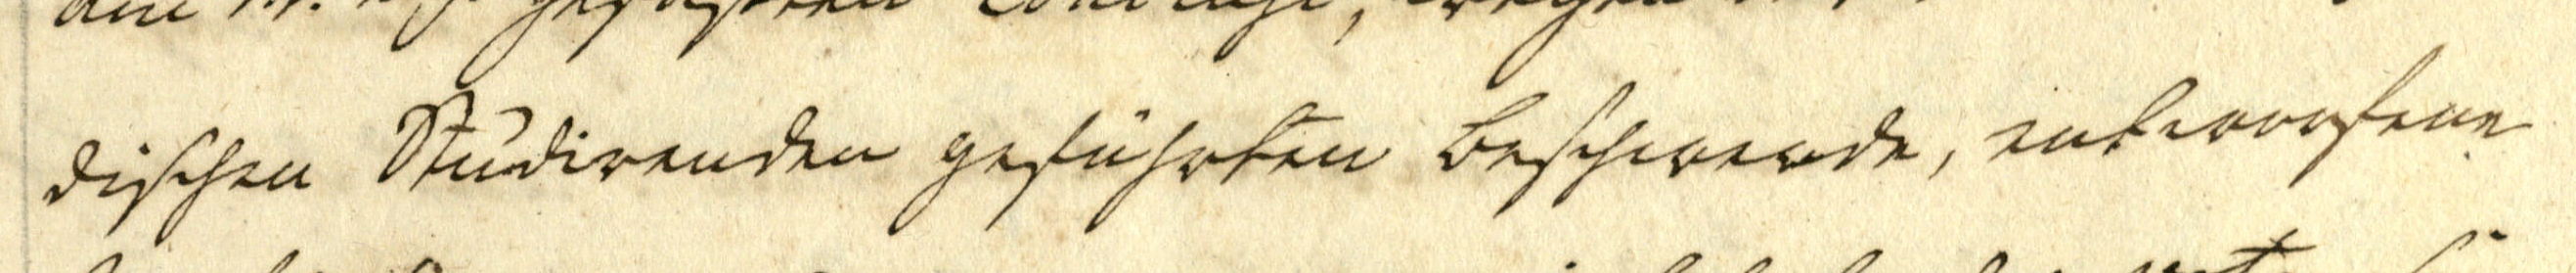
dischen Studirenden geführten Beschwerde, entworfene
